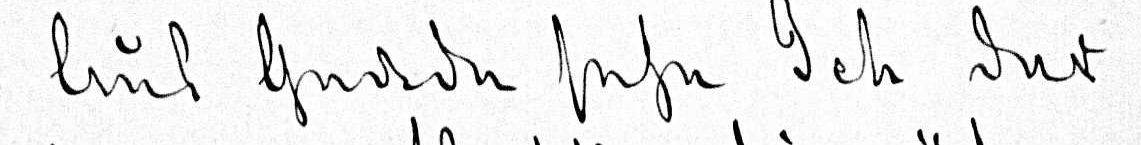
Aus Gnade sehe ich der
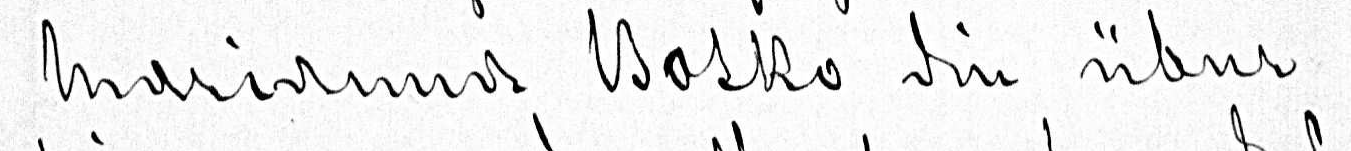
Marianna Botko die über
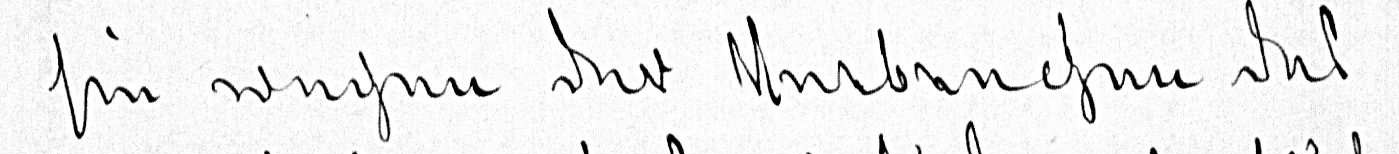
sie wegen der Verbrechen des
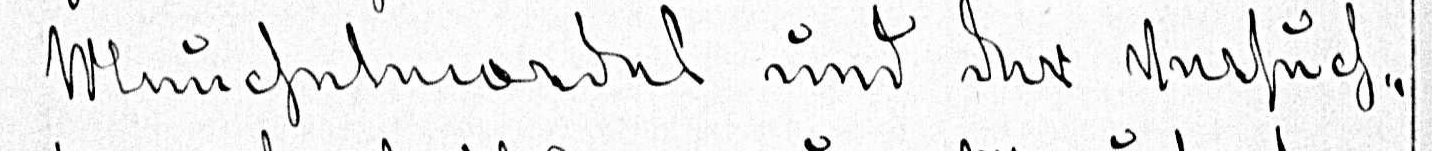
Meuchelmordes und der Versuch¬
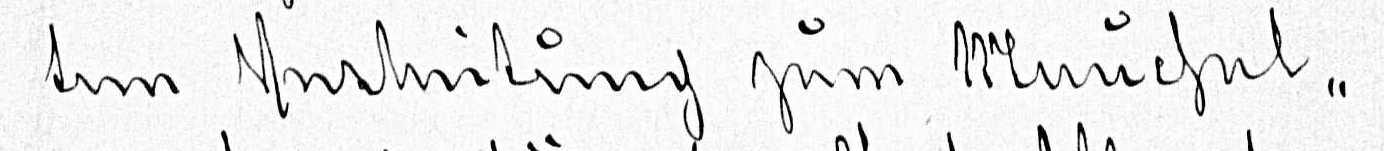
ten Verleitung zum Meuchel¬
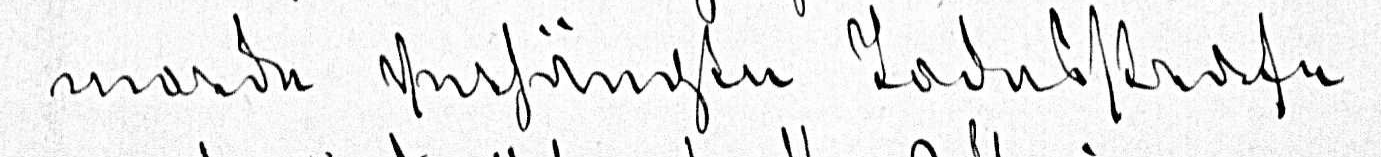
morde verhängte Todesstrafe
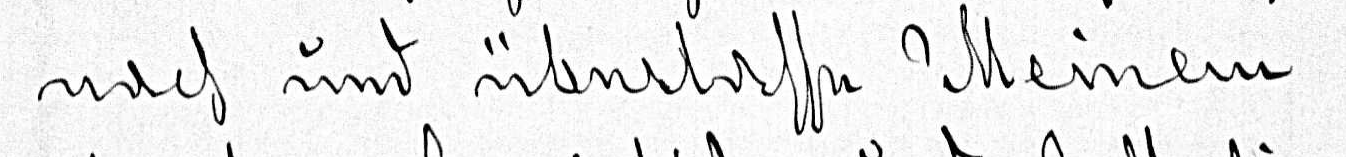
nach, und überlasse Meinem
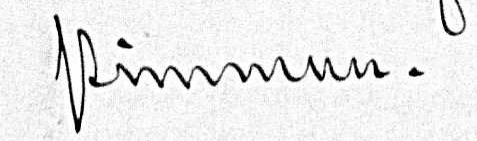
stimmen.
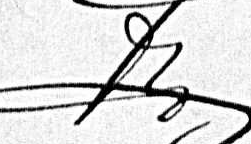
FJ
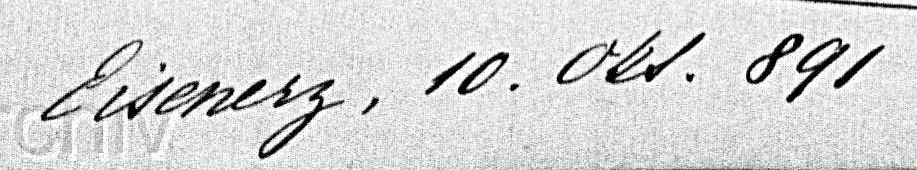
Eisenerz, 10. Okt. 1891
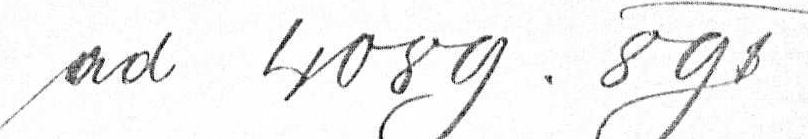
ad 4089 – 1891
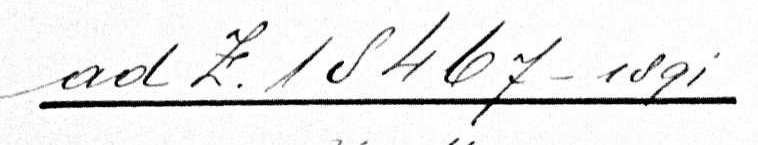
ad Z. 18467 – 1891/
